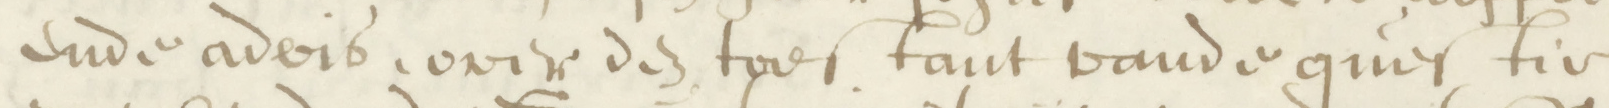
ende advis, over den toestant vande questie
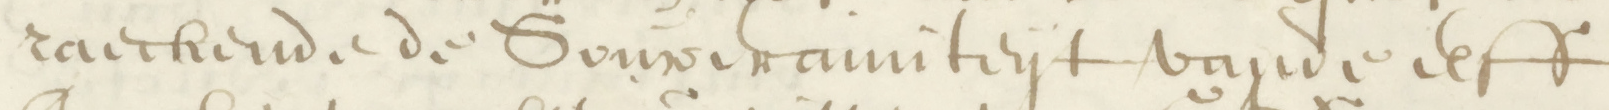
raeckende de Souverainiteijt vande Elff
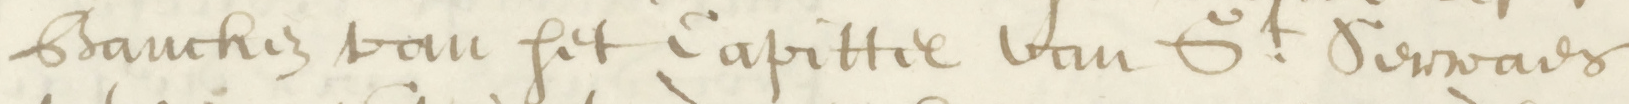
Bancken van het Capittel van St. Servaes
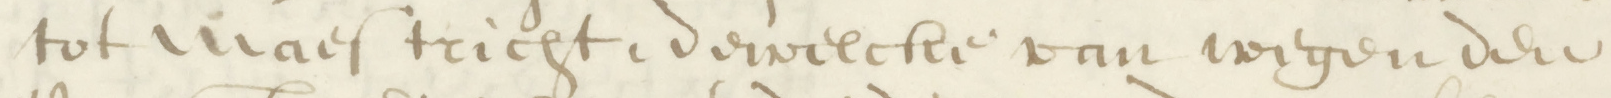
tot Maestricht, dewelcke van wegen den
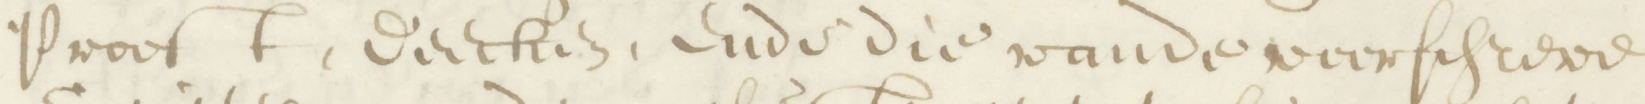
Proost, Deecken, Ende die vande voorschreve
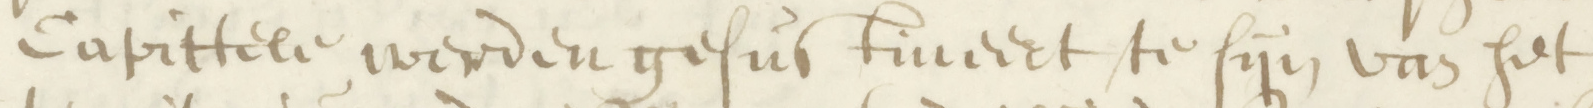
Capittele werden gesustineert te sijn van het
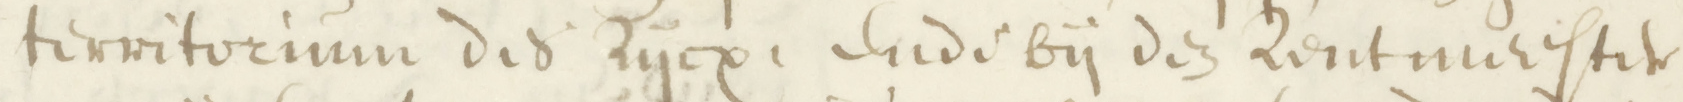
territorium des Rijcx, ende bij den Rentmeester
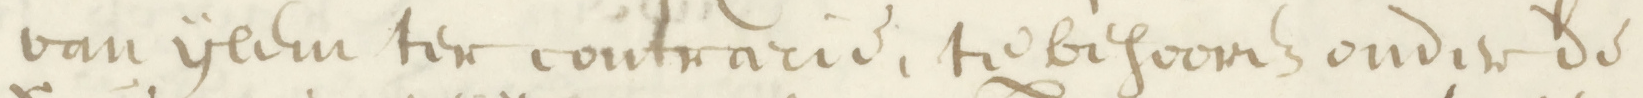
van IJlem ter contrarie, te behooren onder de
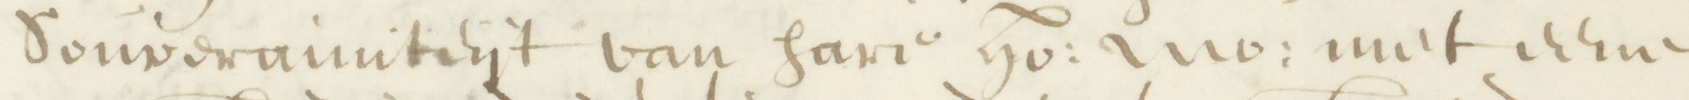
Souverainiteijt van hare Ho:Mo: met eene
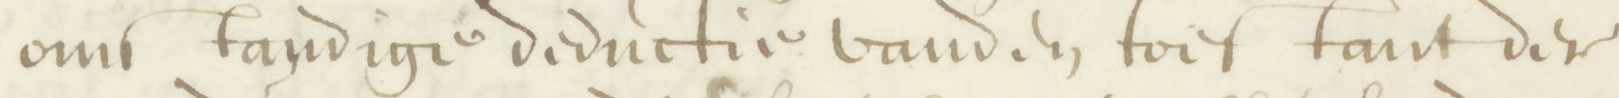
omstandige deductie vanden toestant der
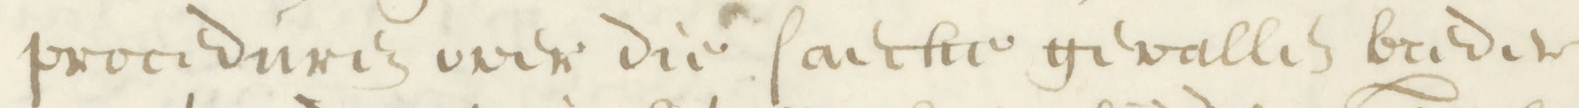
proceduren over die saecke gevallen breder
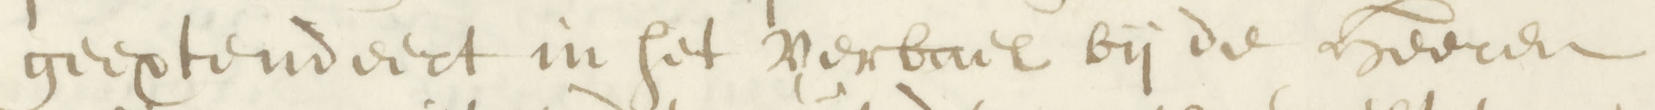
geextendeert in het Verbael bij de Heeren
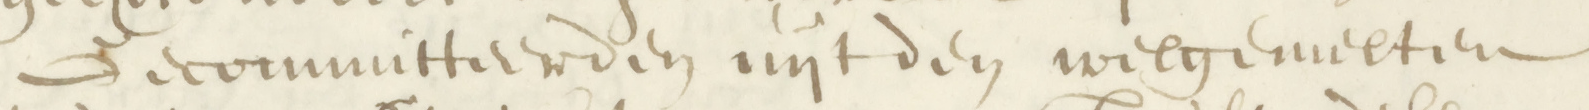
Gecommitteerden uijt den welgemelten
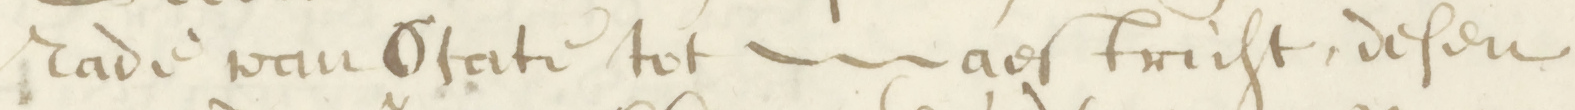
Rade van State tot Maestricht, desen
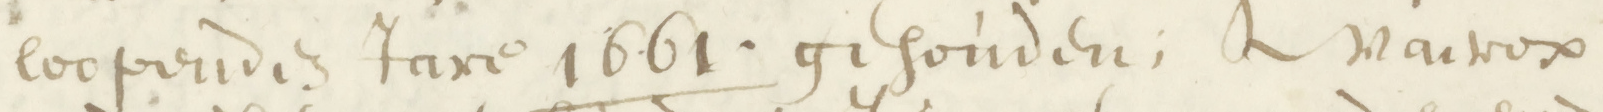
loopenden Jare 1661. gehouden; Waerop
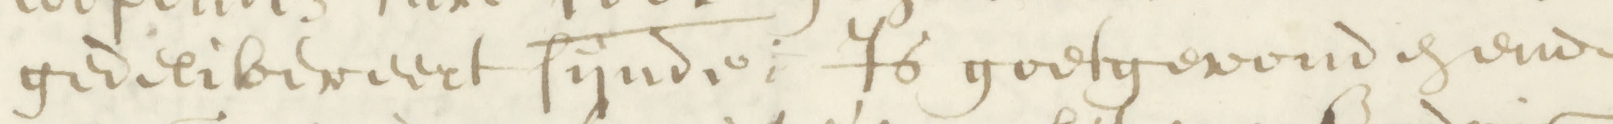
gedelibereert sijnde, Is goetgevonden ende
